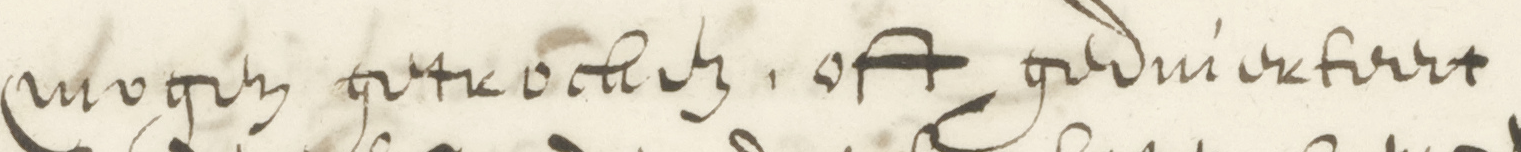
mogen getrocken, oft gediuerteert
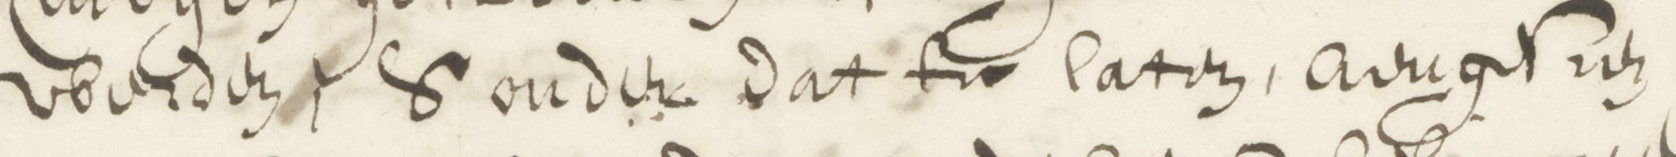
werden, sonder dat te laten, aengesien
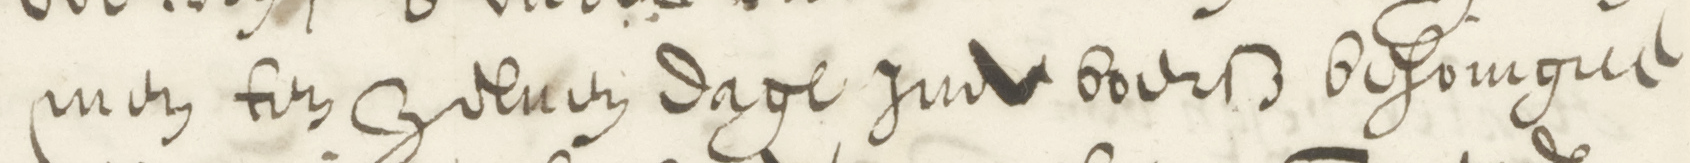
men ten zelven dage inde voers besoingne
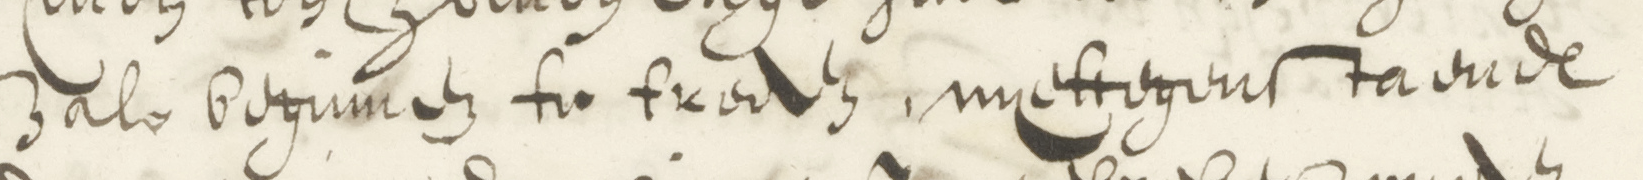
zal beginnen te treden, nyettegenstaende
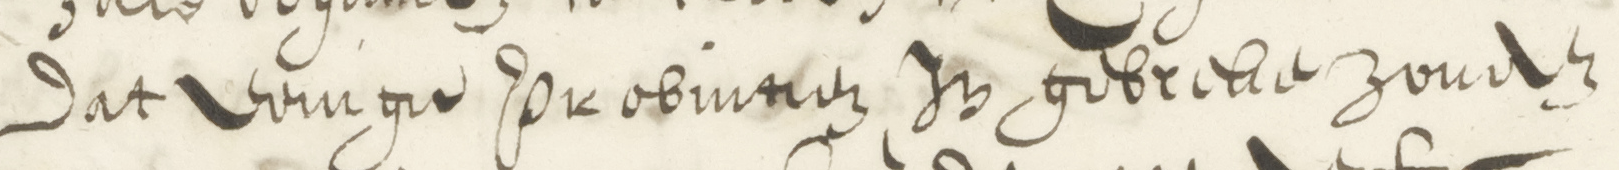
dat eenige provintien In gebreke zouden
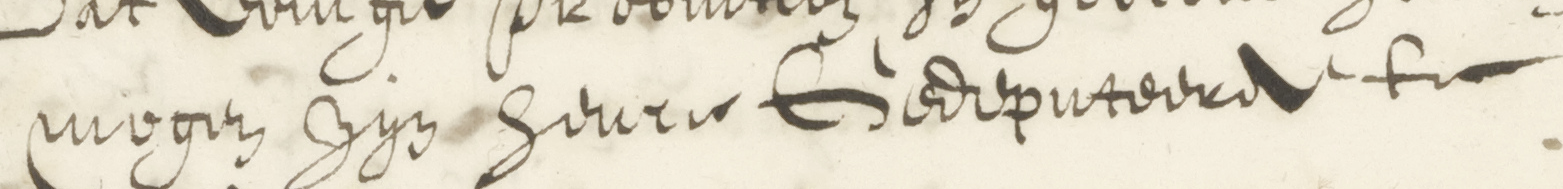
mogen zyn heure Gedeputeerde te
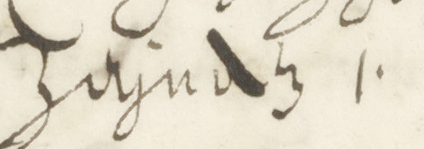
zeynden.
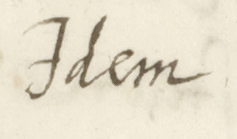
Idem
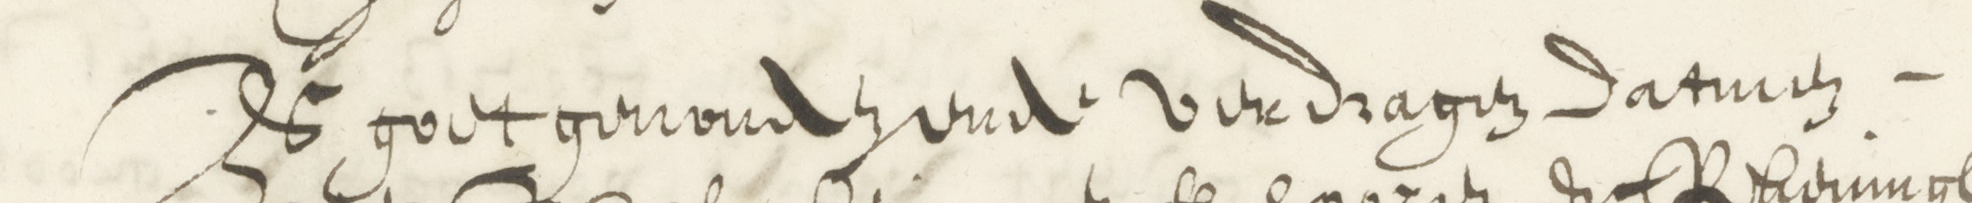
Is goetgeuonden ende verdragen datmen -
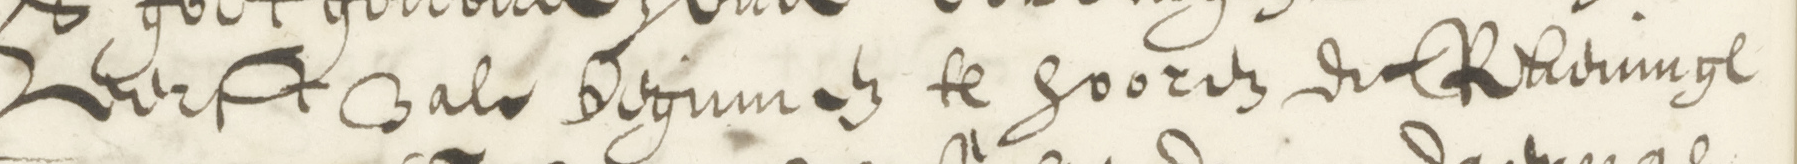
eerst zal beginnen te hooren de Rekeninge
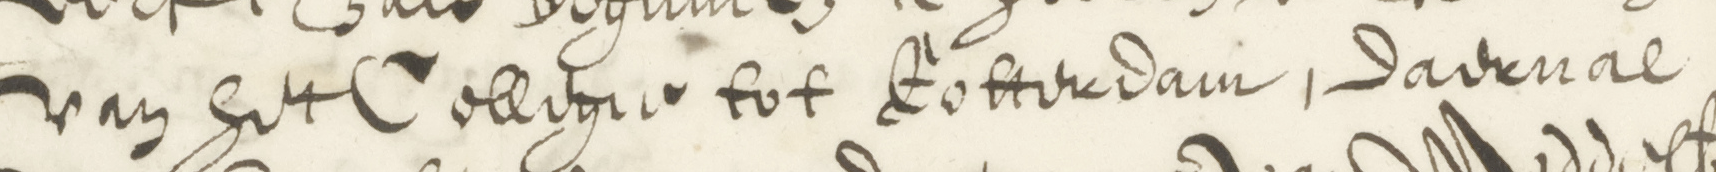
van het Collegie tot Rotterdam, daernae
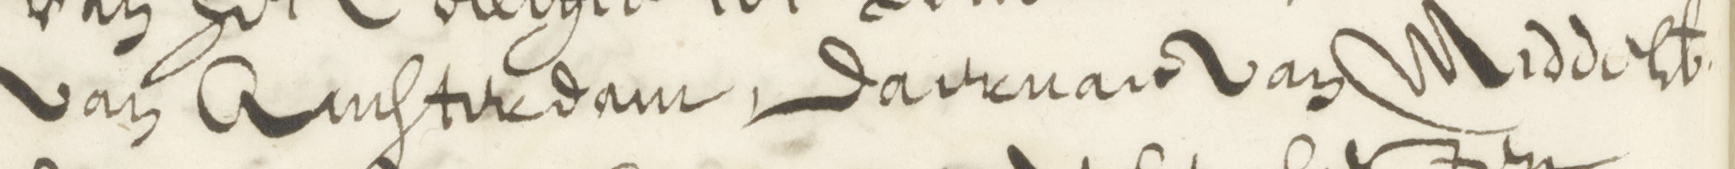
van Amsterdam, daernae van Middelb.
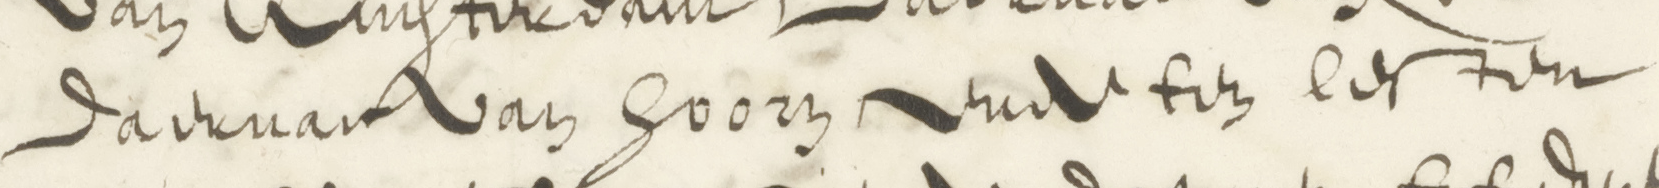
daernae van Hoorn ende ten lesten
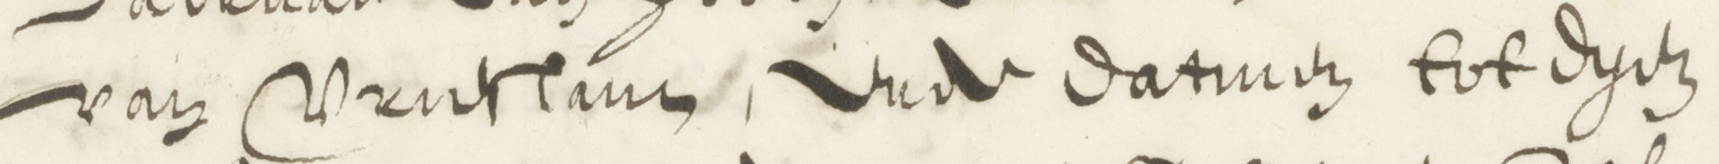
van Vrieslant, ende datmen tot dyen
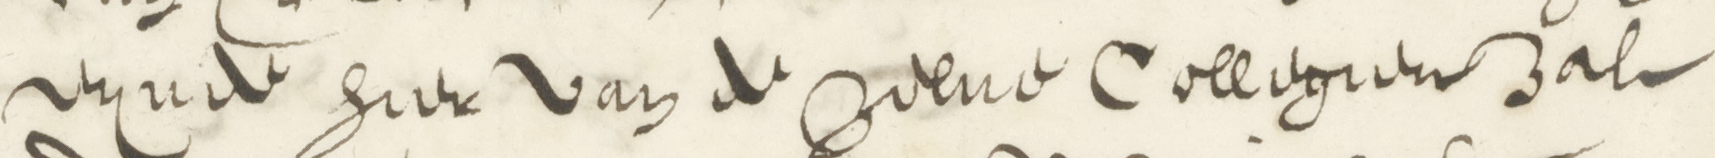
eynde hier van de zelue Collegien zal
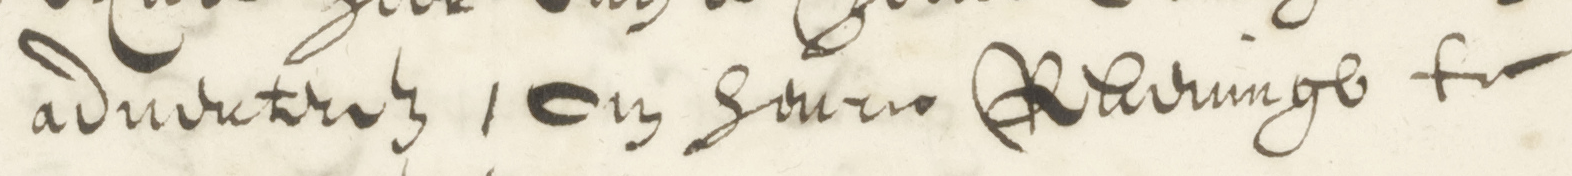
aduerteren, om heure Rekeninge te
